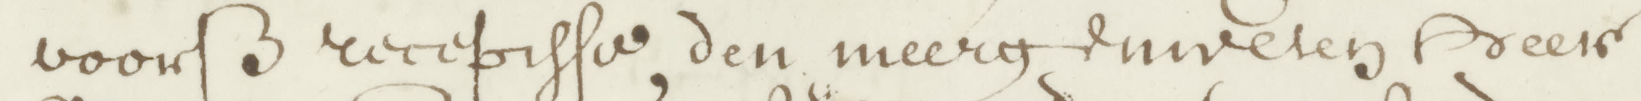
voors recepisse den meergemelten heer
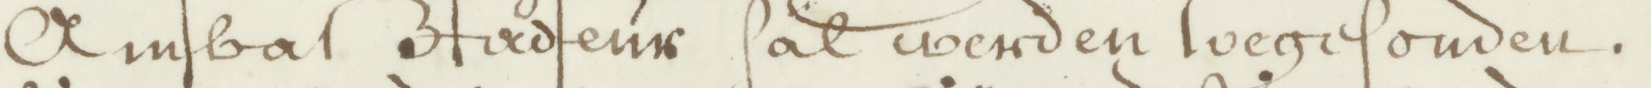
Ambassadeur sal werden toegesonden
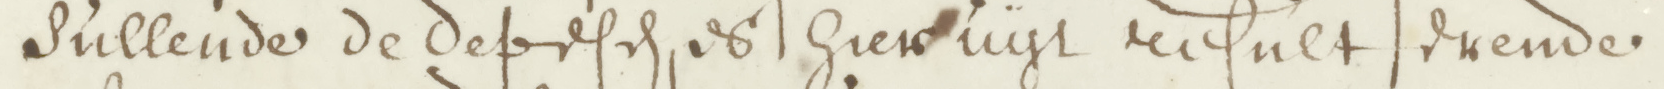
sullende de depesches hieruijt resulterende
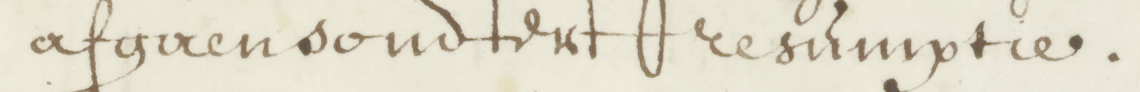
afgaen sonder resumptie.
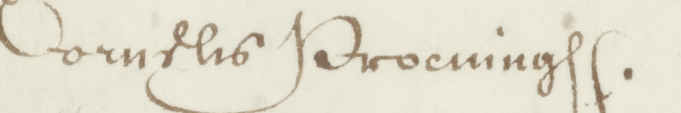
Cornelis Proeningh.
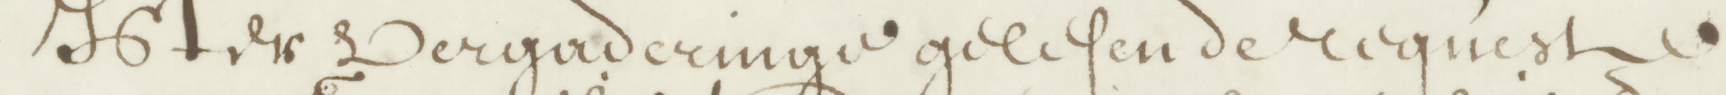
Is ter vergaderinge gelesen de requeste
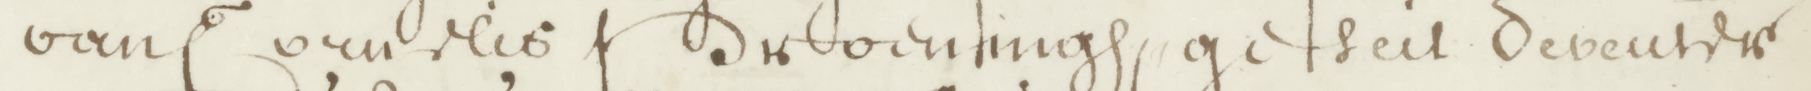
van Cornelis Proeningh geseit Deventer
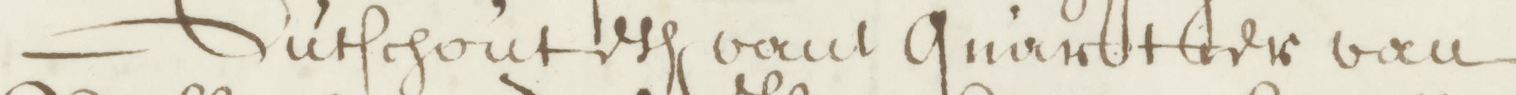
Outschouteth vant quartier van
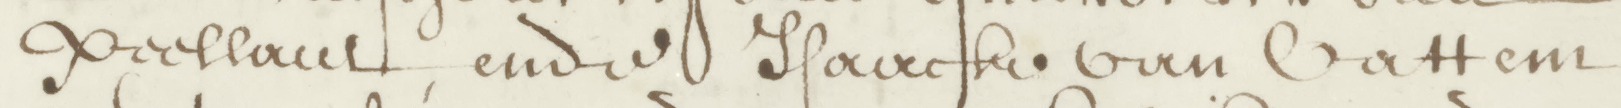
Peellant, ende Isaack van Hattem
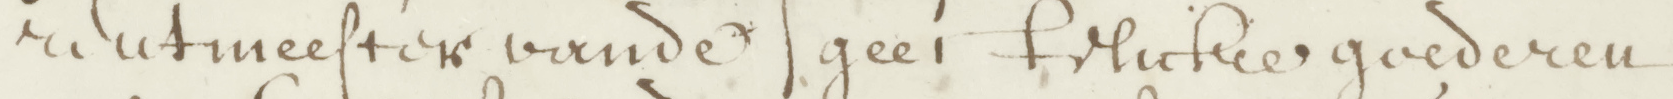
rentmeester vande geestelicke goederen
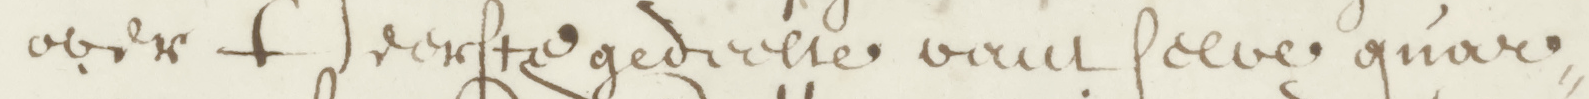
over t eerste gedeelte vant selve quar„
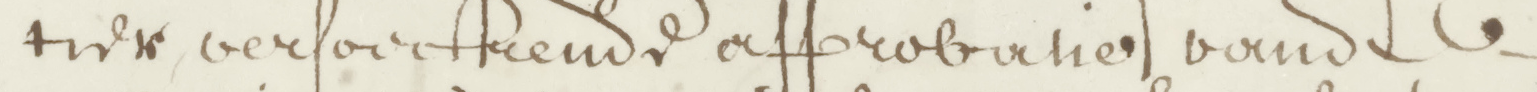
tier, versoeckende approbatie vande
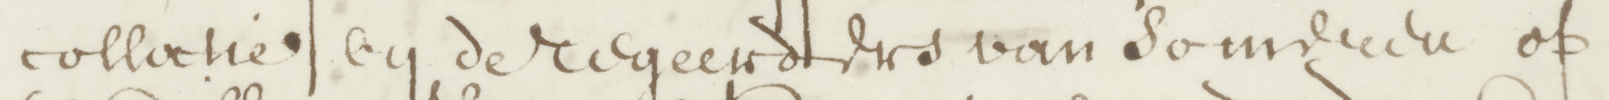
collatie bij de regeerders van Someren op
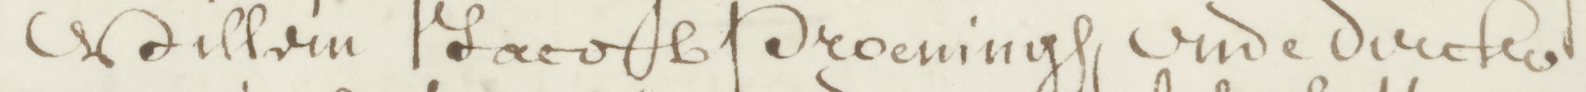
Willem Jacob Proeningh ende Derck
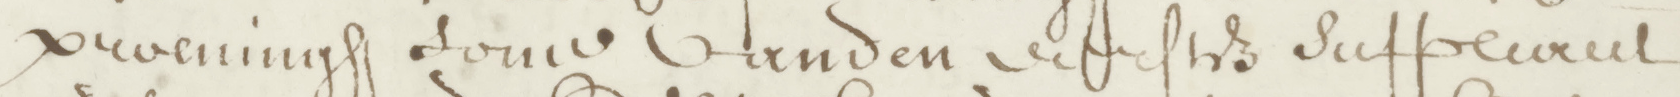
Proeningh sone vanden eersten suppliant
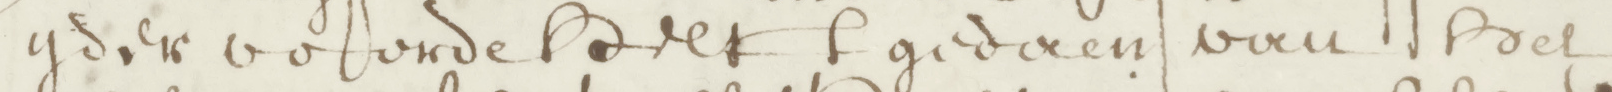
yder voor de helft gedaen van het
